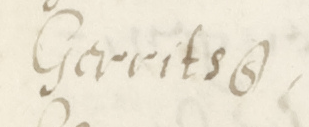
Gerritsz,
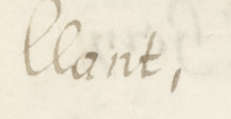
Clant,
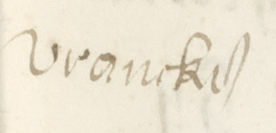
Vranck
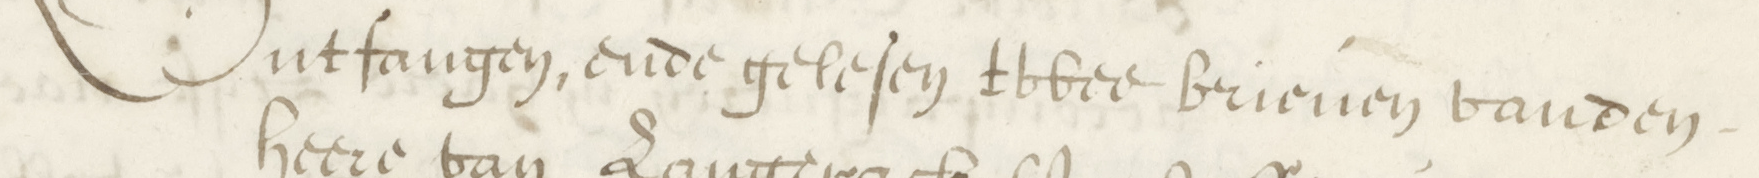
Ontfangen, ende gelesen twee brieuen vanden
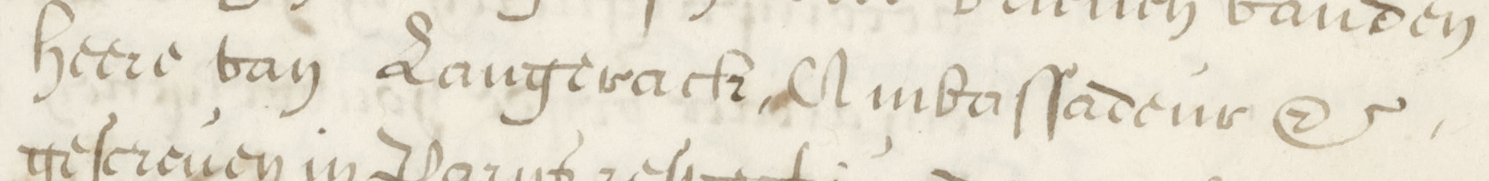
heere van Langerack, Ambassadeur @
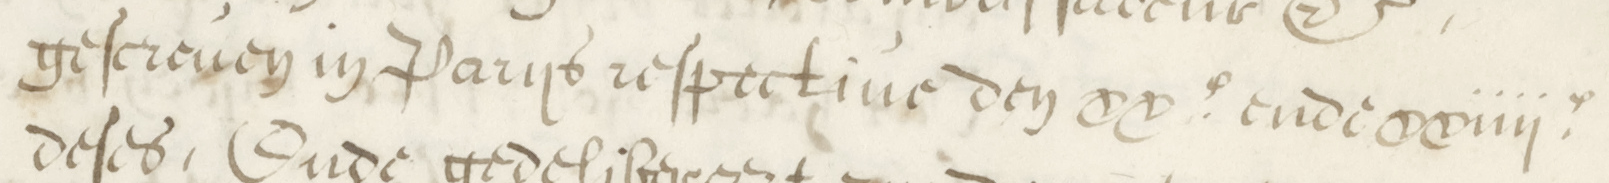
gescreuen in Parys respectiue den xxen. ende xxiiijen.
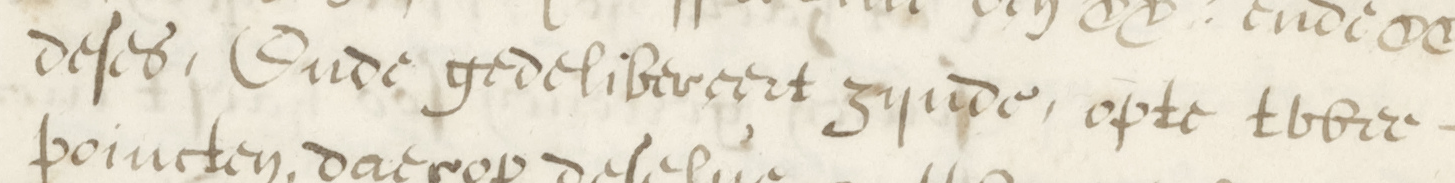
deses. Ende gedelibereert zynde, opte twee
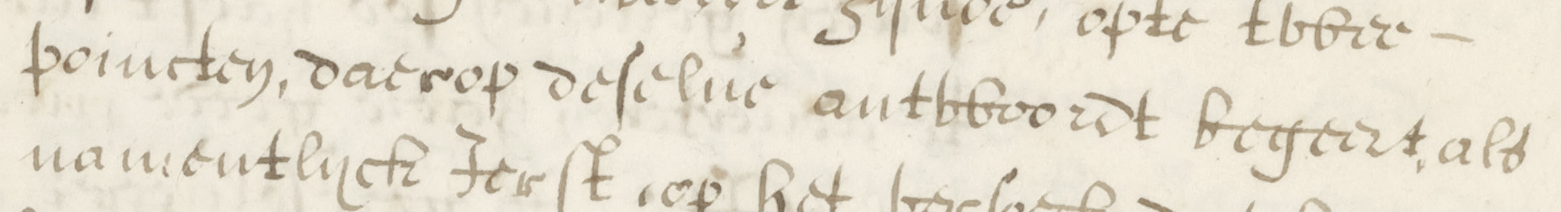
poincten, daerop deselue antwoordt begeert, als
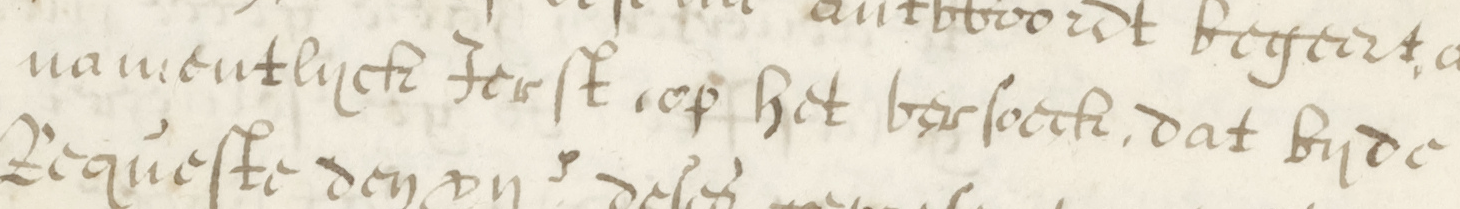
namentlyck Ierst, op het versoeck, dat byde
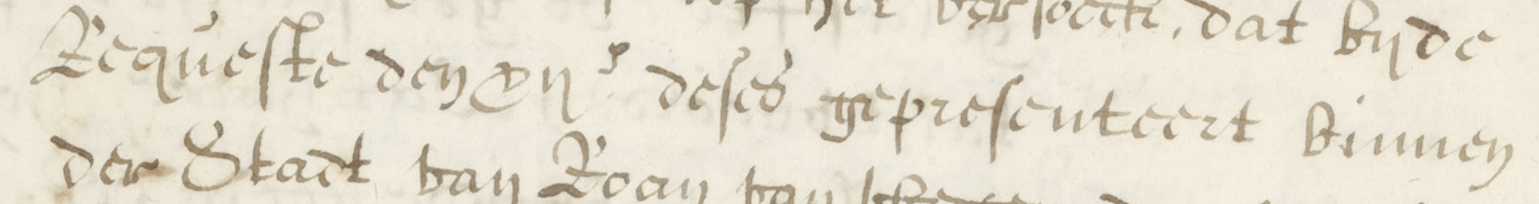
Requeste den xijen deses, gepresenteert binnen
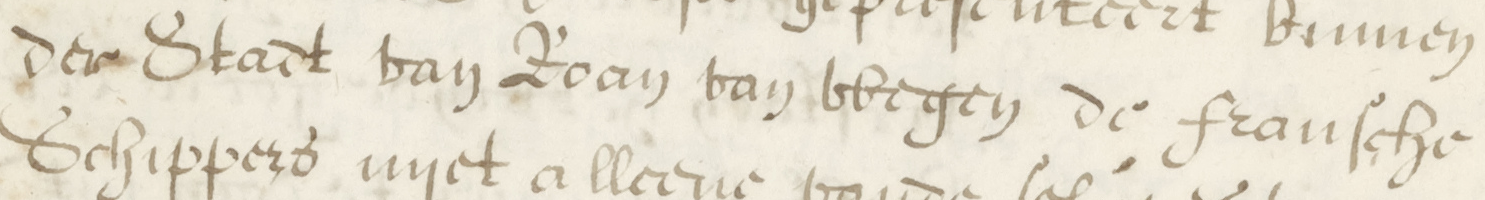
der Stadt van Roan van wegen de fransche
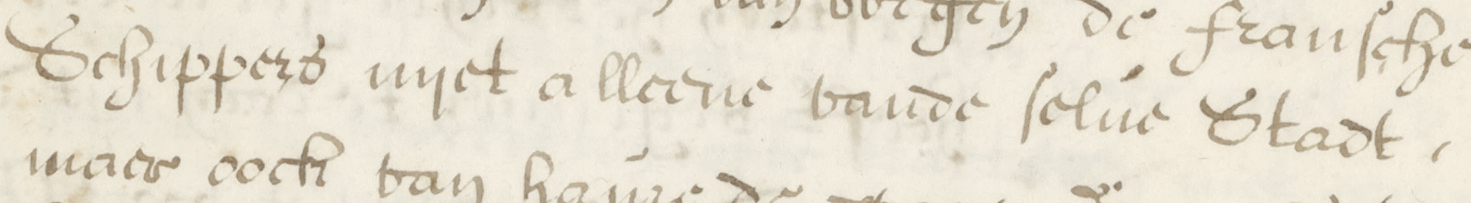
Schippers nyet alleene vande selue Stadt.
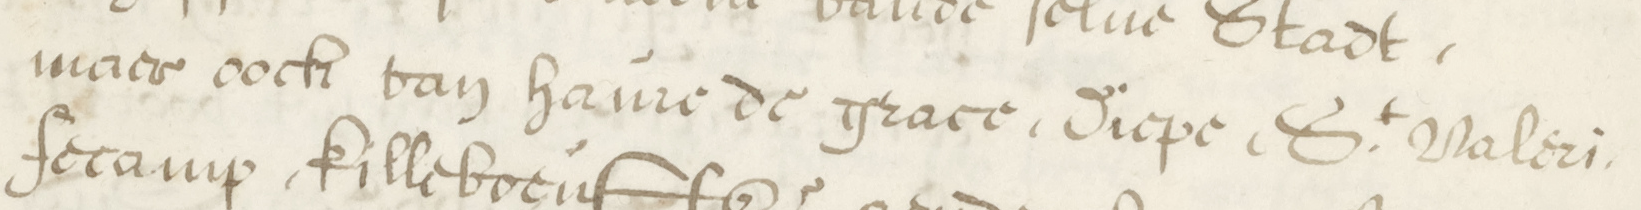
maer oock van haure de grace, Diepe St. Valeri,
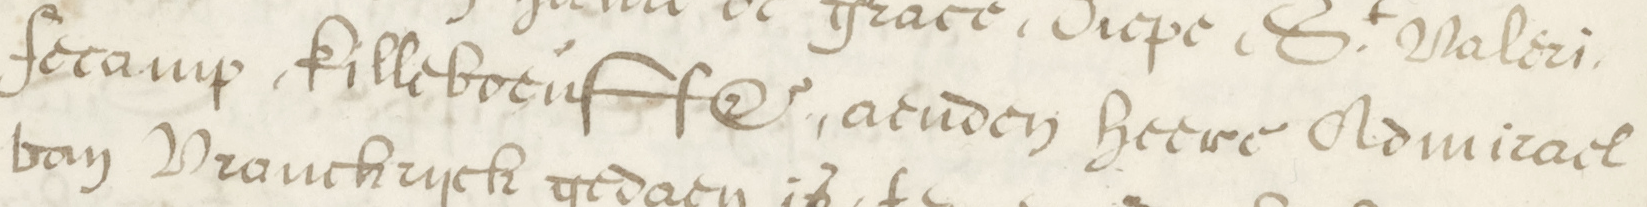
Fecamp, Killeboeuff @, aenden heere Admirael
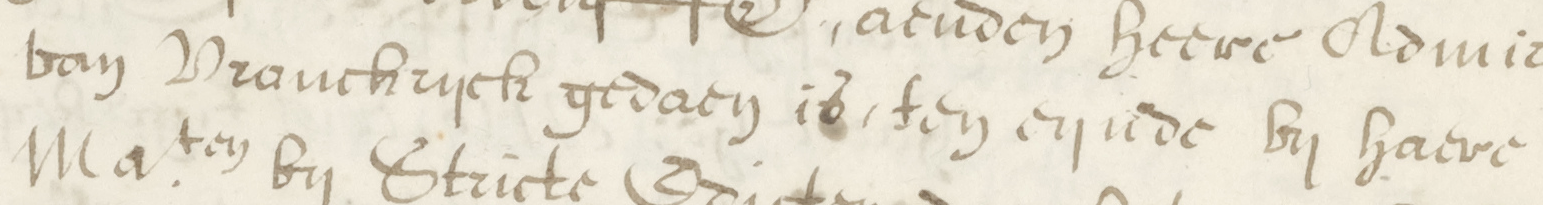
van Vranckryck gedaen is, ten eynde by haere
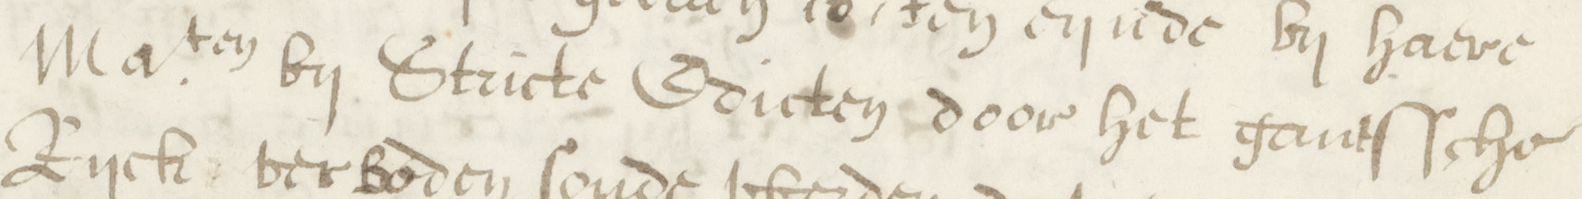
Maten. by Stricte Edicten, door het gantssche
